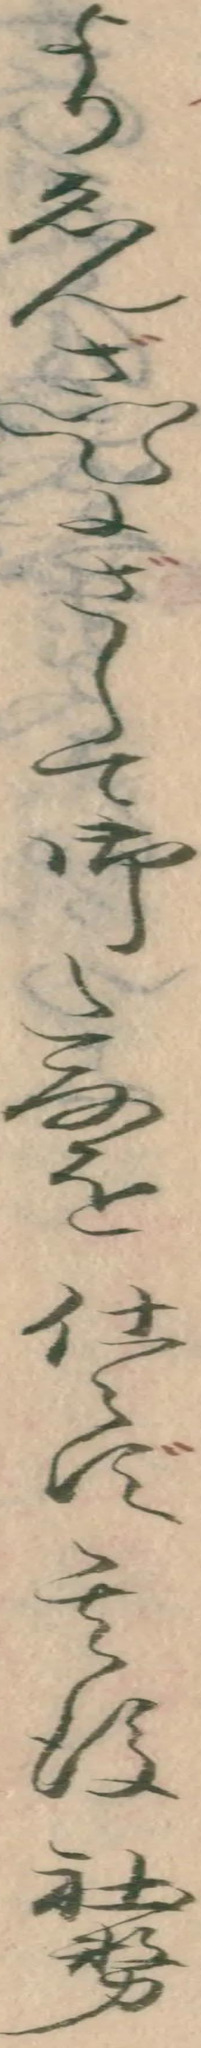よりゑんざにざして御たなを仕らず其後社務
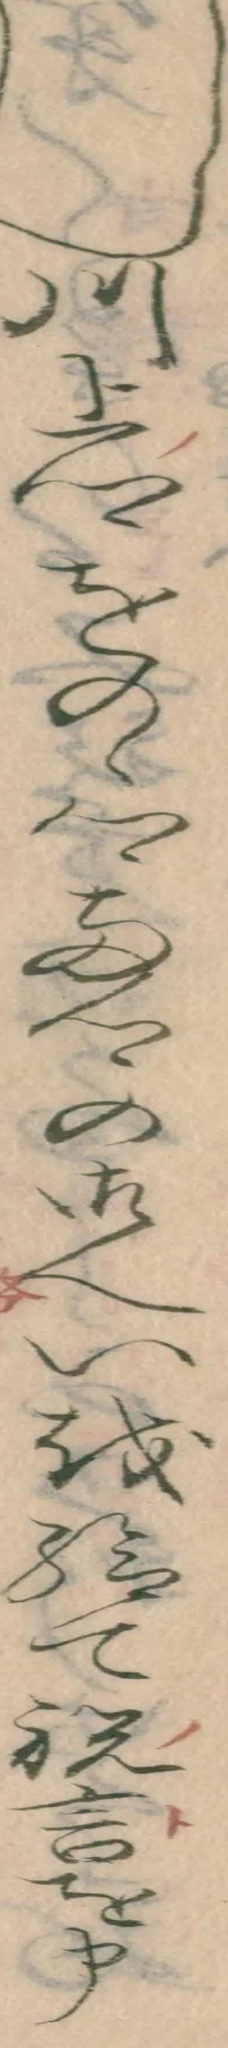川上卿をのゝ卿両卿の御へいを給て祝言を申
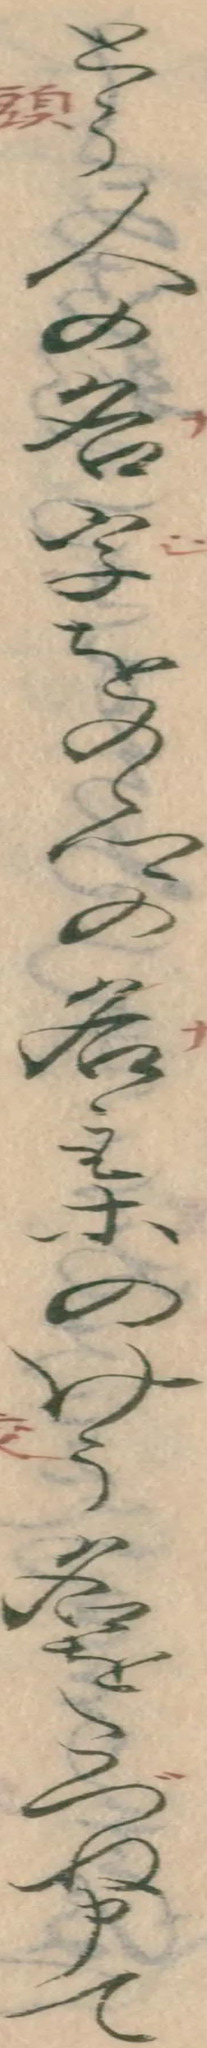とう人の名字をのゝ卿の名主等のけう名をたづね申て
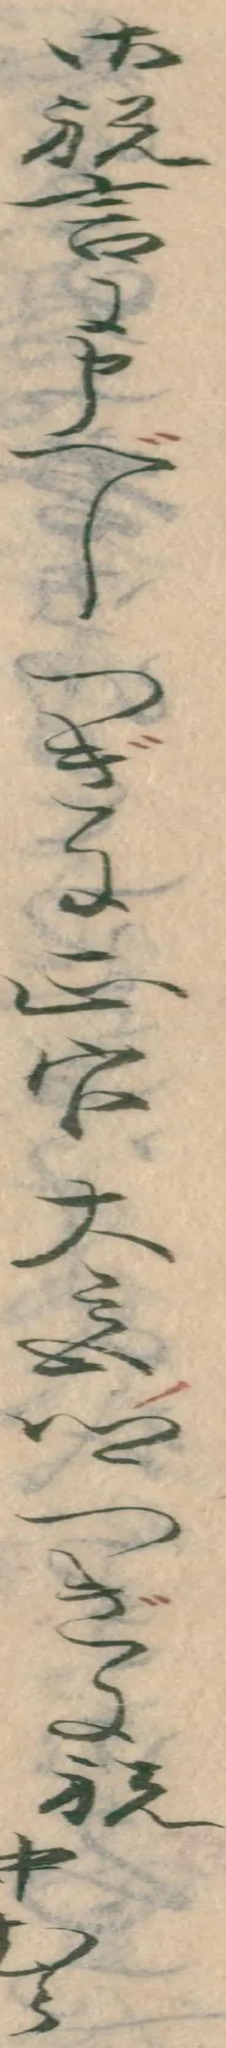御祝言に申べしつぎに正官大宮卿つぎに祝中むら卿
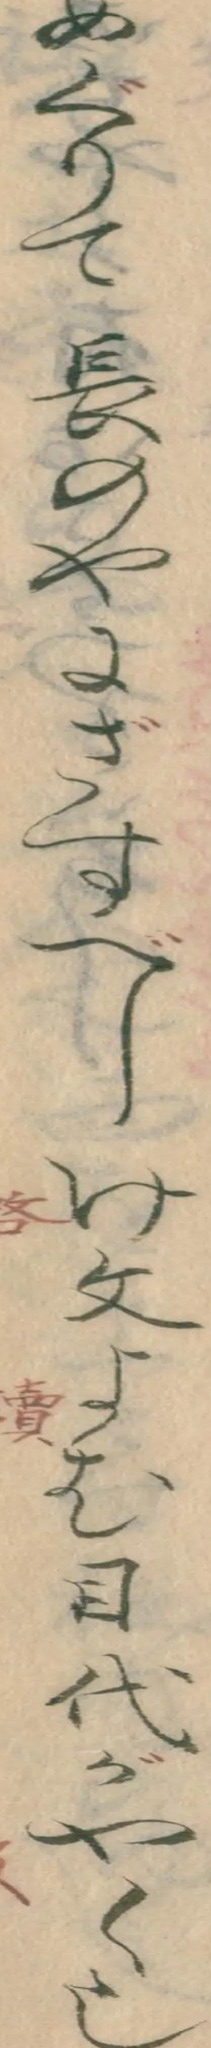めぐりて長のやにざすべしけ文よむ目代がやく也

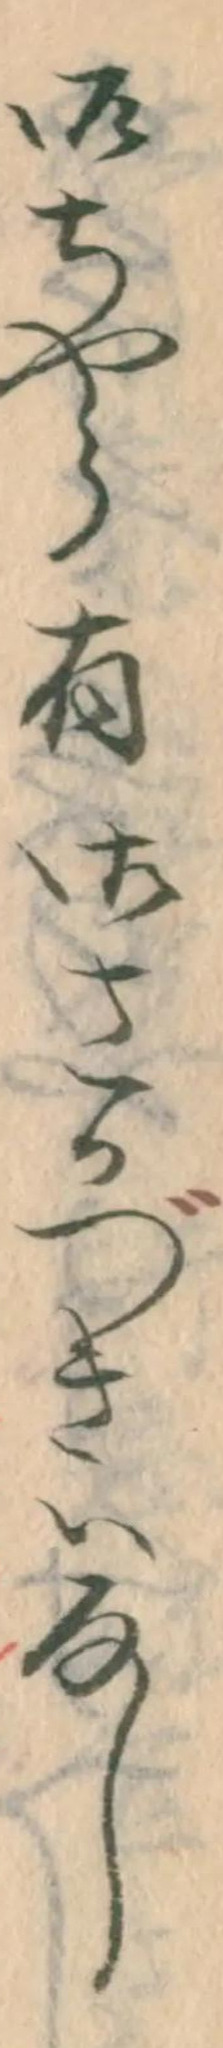御ちやう有御さかづきはなし
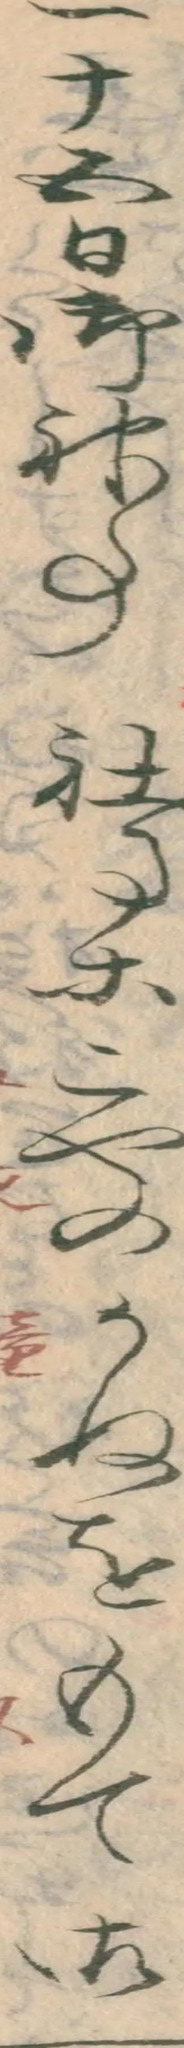一十五日御神事社司等こやのかねをもて御
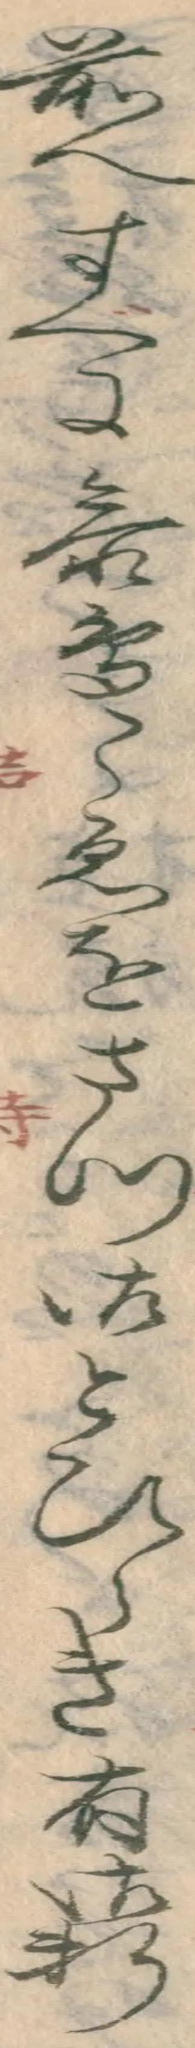前へすぐに参鳥こゑをまつ御とひらき有御料
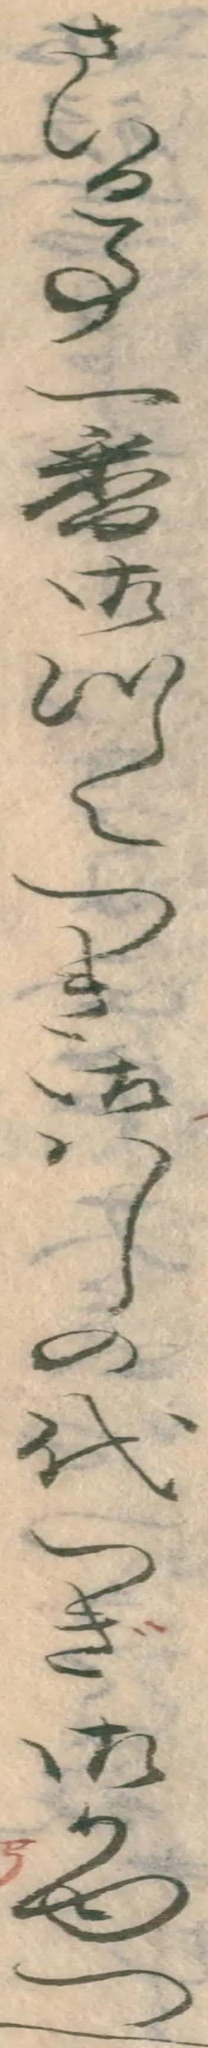まいる事一番御つえつき御はしの代つぎ御かゆつえ歟
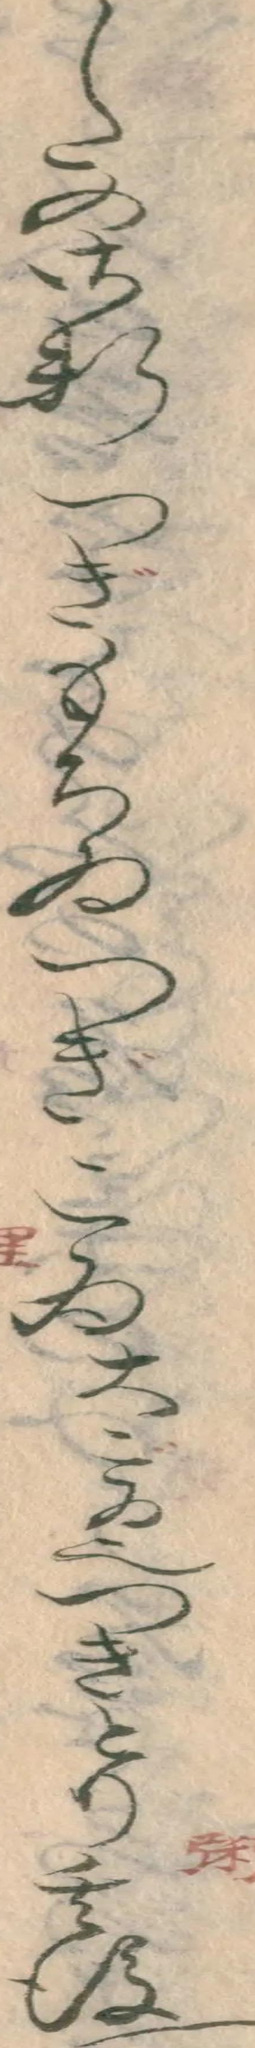したの御料つぎもちゐつぎこゐ大ごゐ也つきとり其後
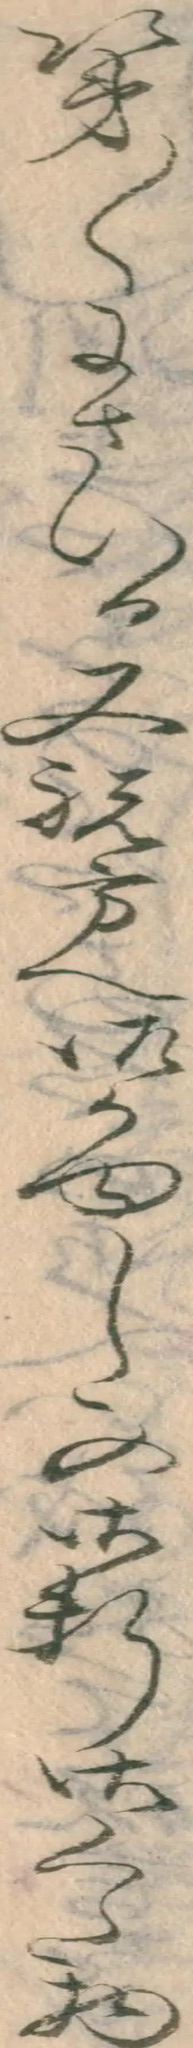次第〳〵にまいる又祝方へ御かゆしたの御料御くた物
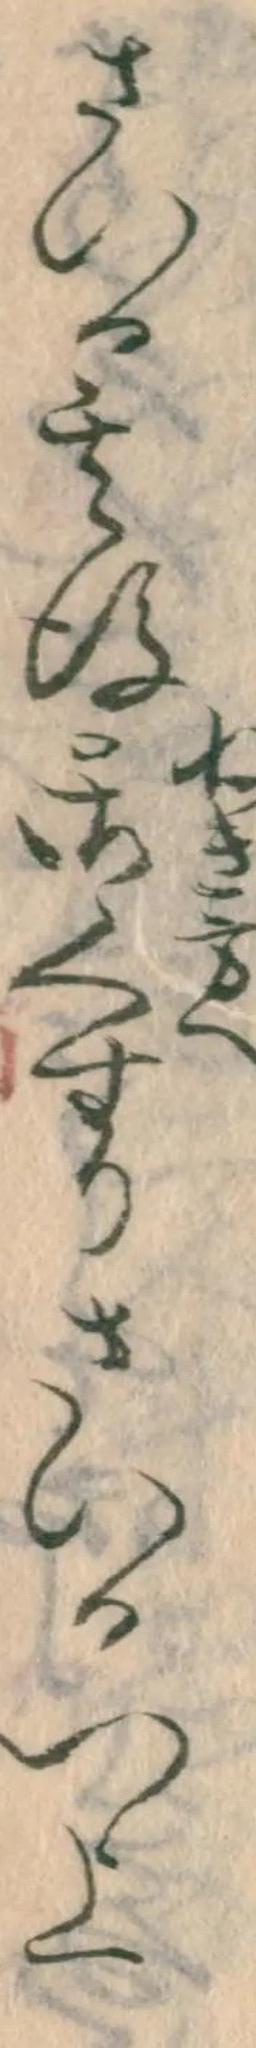まいる其後◦御くすりまいるい上
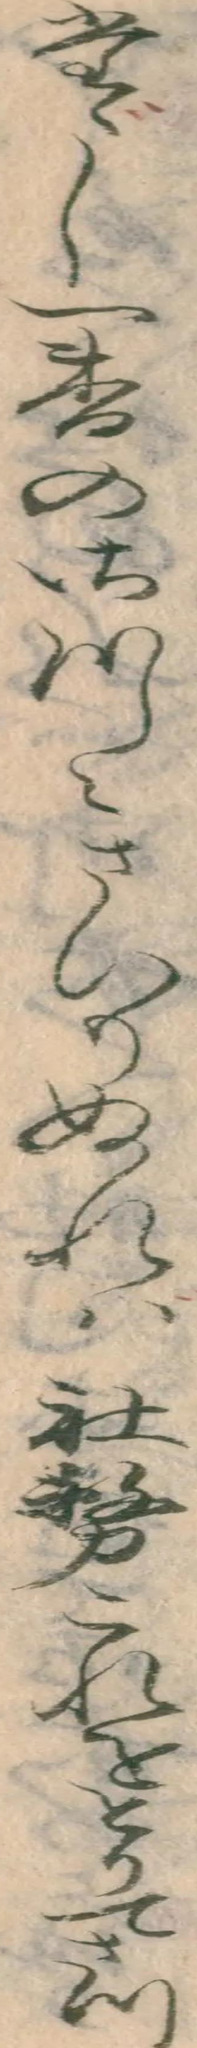たゞし一番の御つえまいりぬれば社務これをとりてまつ
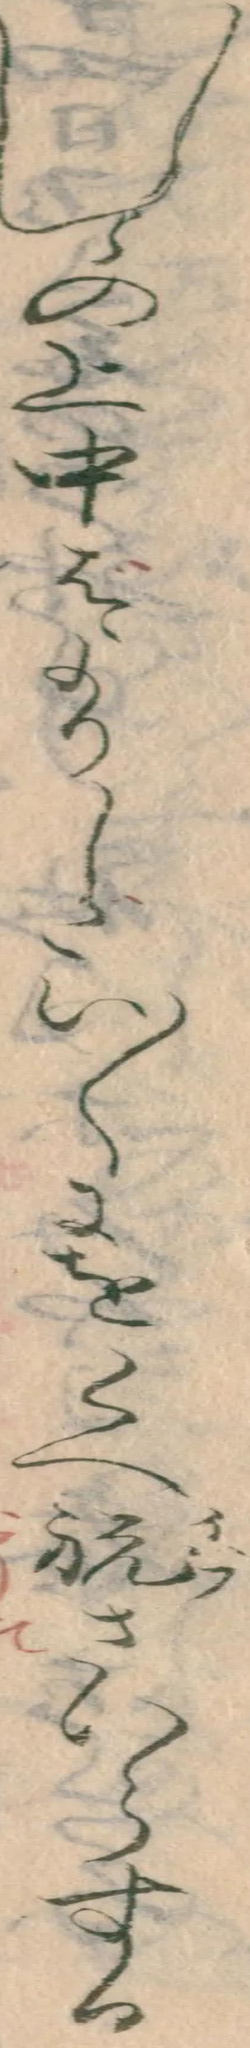の上中ばよりしだい〳〵にをくへ祝まいらする
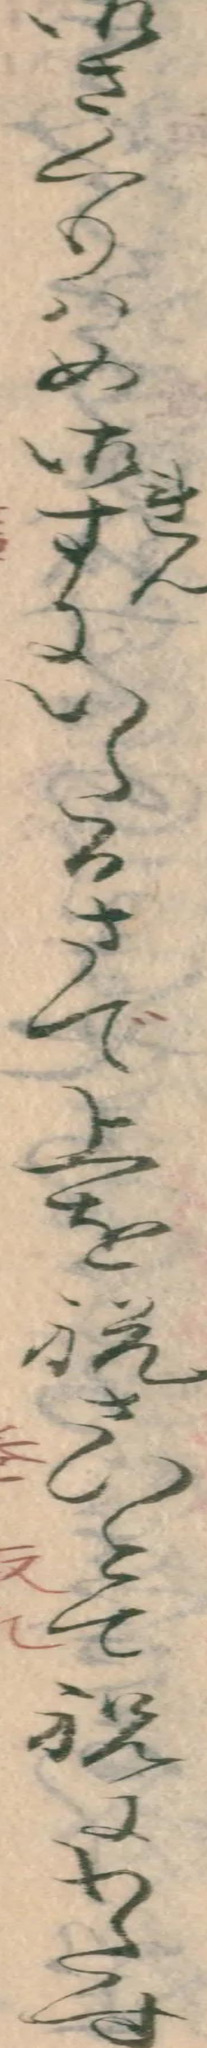御まくりはめ御すにいたるまで上を祝まいとて祝にわたす
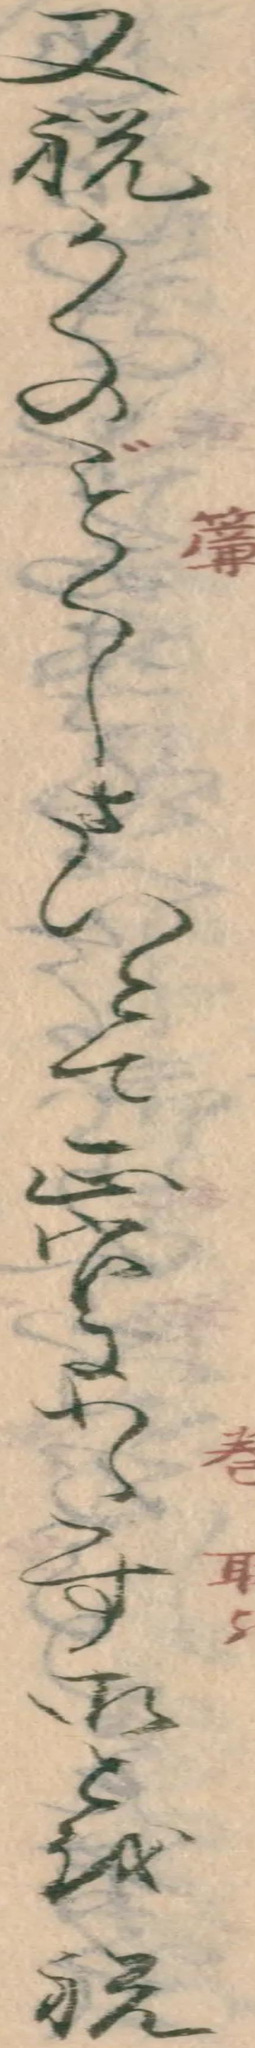又祝かくのごとくしまいとて正官にわたす御とを祝
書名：賀茂社記録. 第3冊
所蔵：国立国会図書館 National Diet Library, JAPAN
